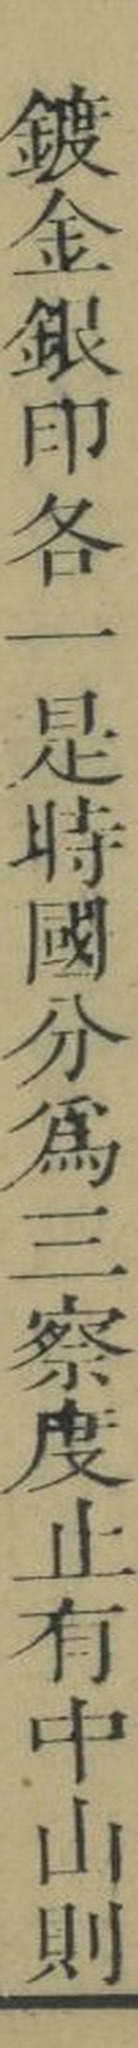鍍金銀印各一是時國分爲三察度止有中山則
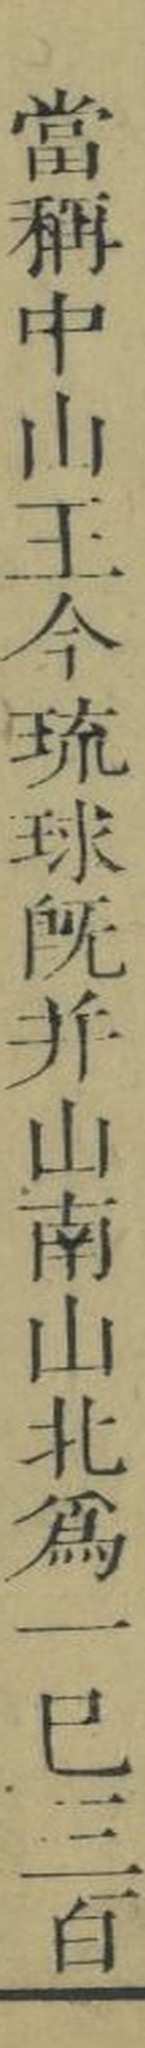當稱中山王今琉球既并山南山北爲一巳三百
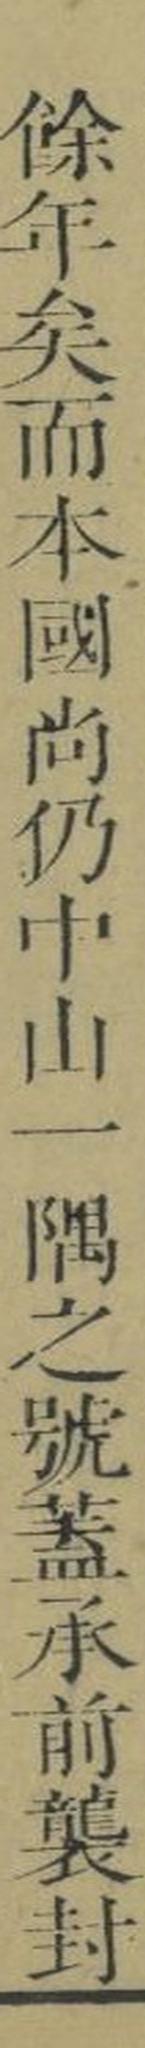餘年矣而本國尚仍中山一隅之號蓋承前襲封
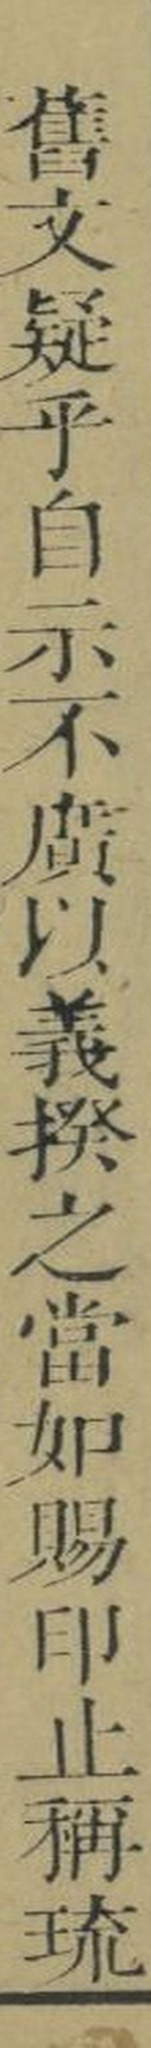舊文疑乎自示不廣以義揆之當如賜印止稱琉
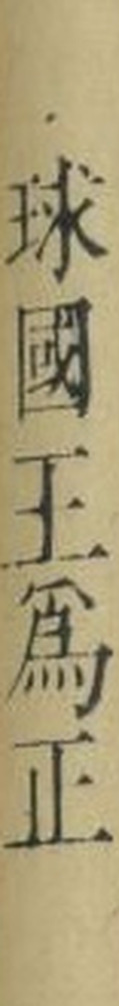球國王爲正

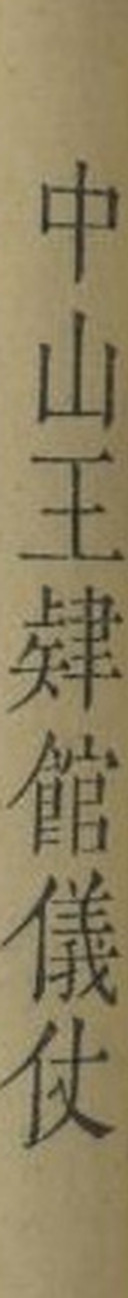中山王肄館儀仗
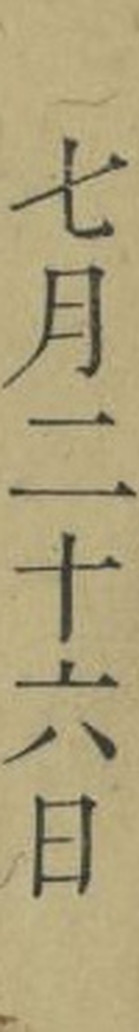七月二十六日
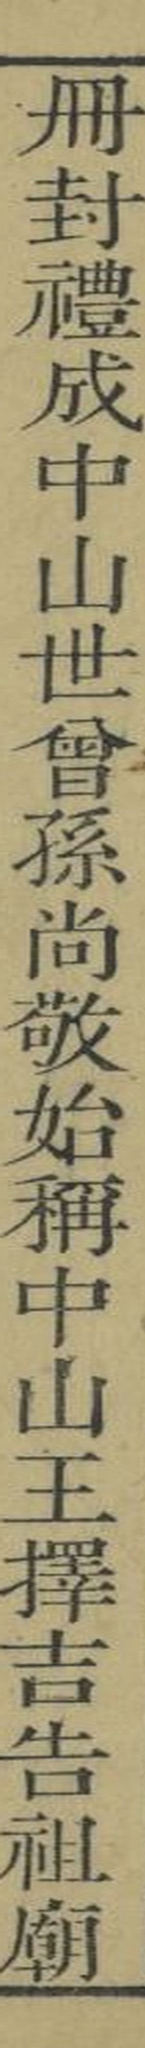冊封禮成中山世曾孫尚敬始稱中山王擇吉告祖廟
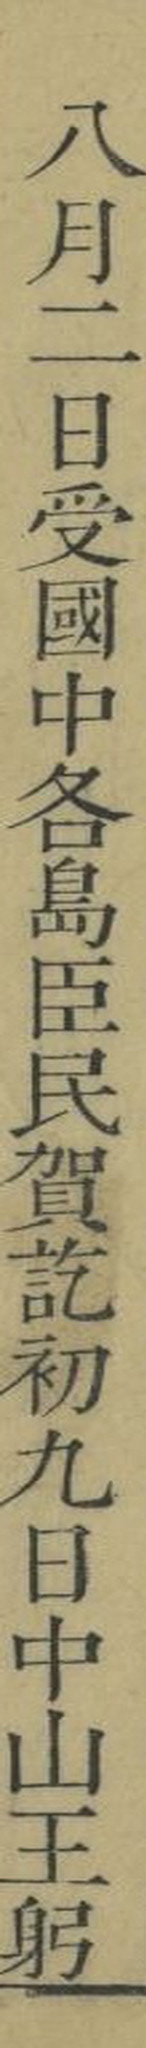八月二日受國中各島臣民賀訖初九日中山王躬
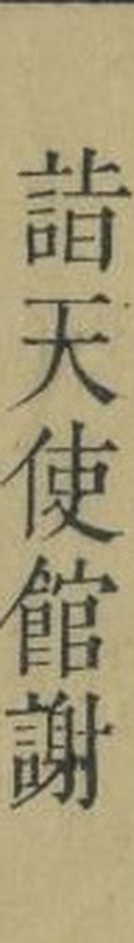詣天使館謝
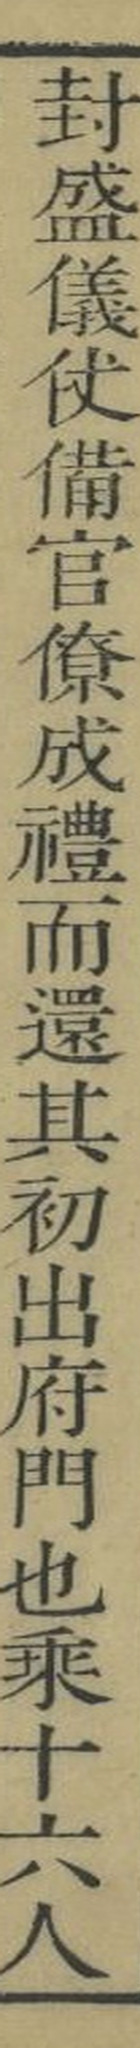封盛儀仗備官僚成禮而還其初出府門也乘十六人
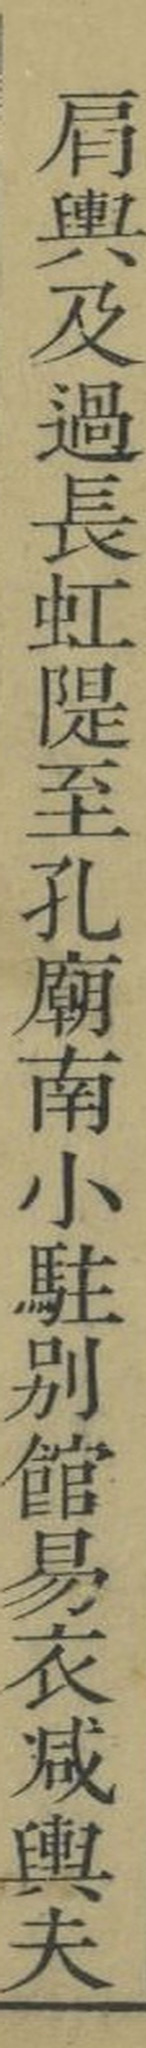肩輿及過長虹隄至孔廟南小駐別館易衣減輿夫
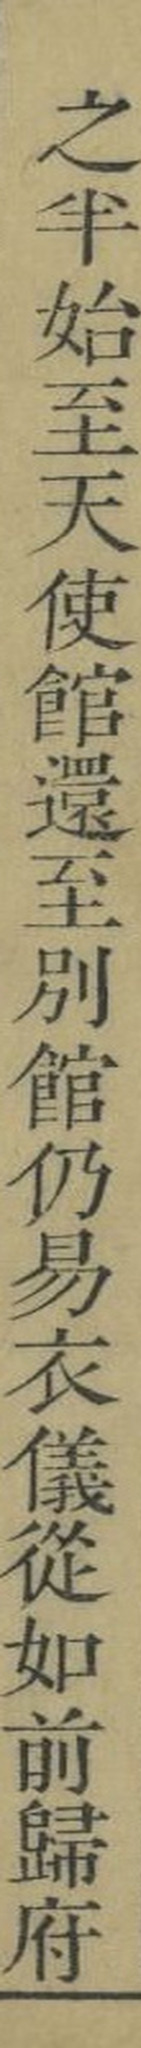之半始至天使館還至別館仍易衣儀從如前歸府
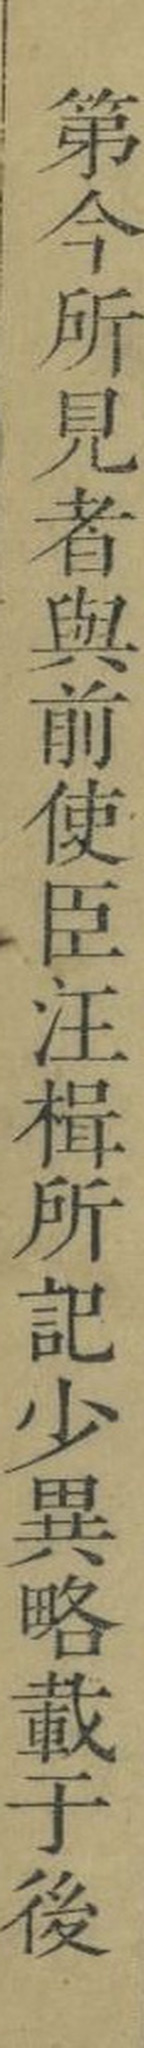第今所見者與前使臣汪楫所記少異略載于後

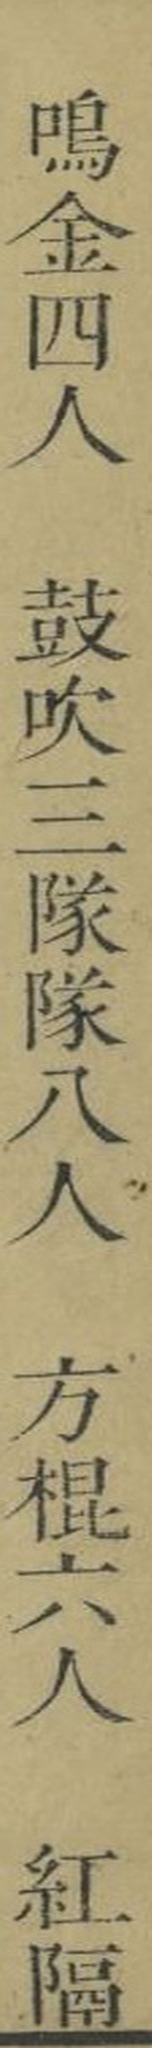鳴金四人鼓吹三隊隊八人方棍六人紅隔
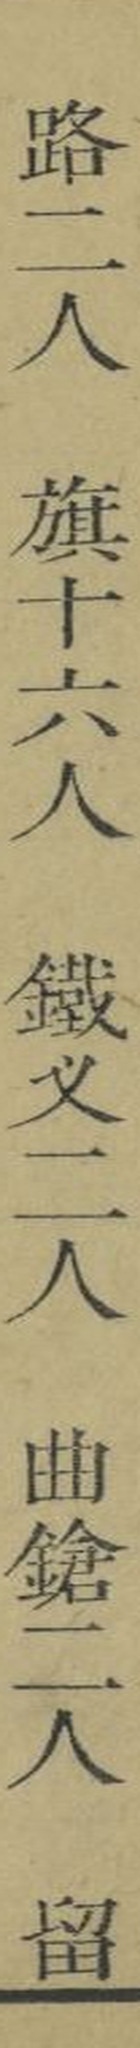路二人旗十六人鐵义二人曲鎗二人留
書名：中山伝信録 巻二
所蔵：University of the Ryukyus Library
